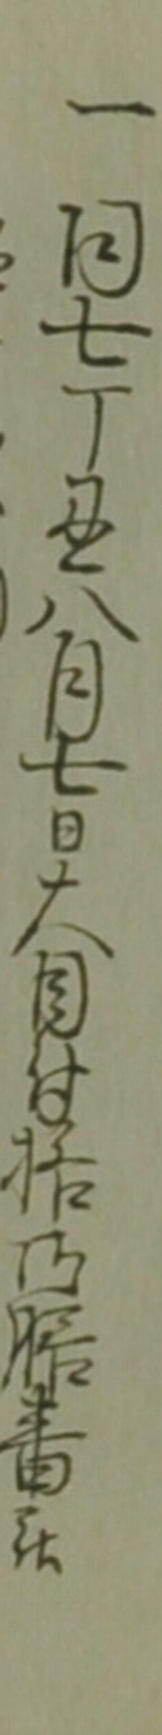一同七丁丑八月七日大目付格御膳番被
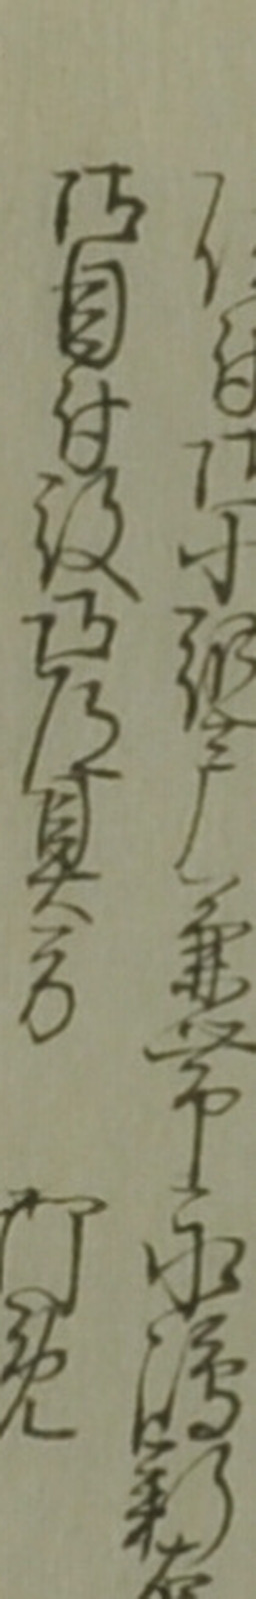御目付役御道具方御免
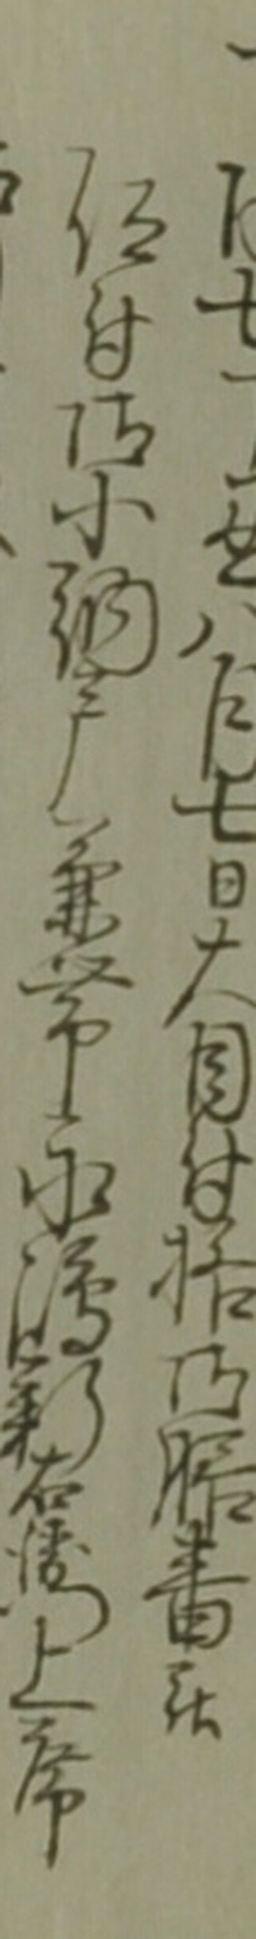仰付御小納戸兼帯永嶋新右衛門上席
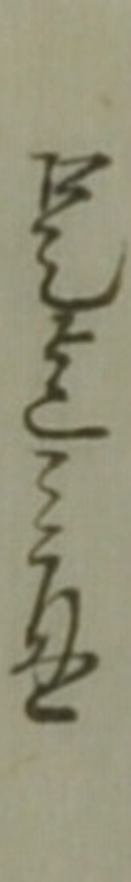是迄之通
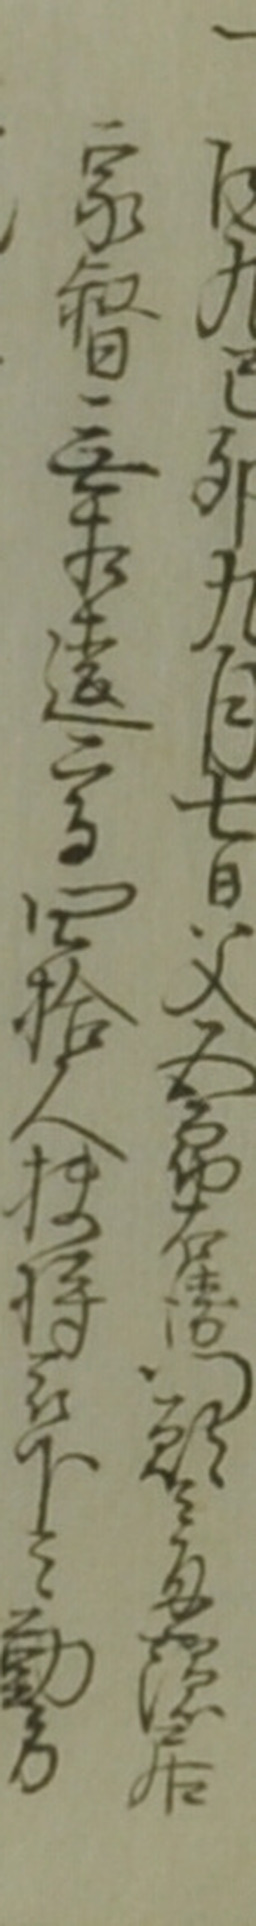家督無相違高四拾人扶持被下之勤方
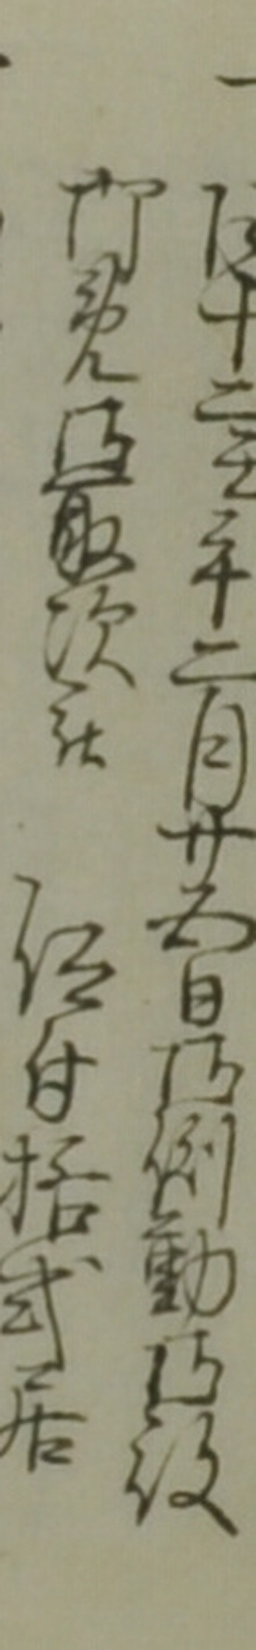御免御取次被仰付格式居
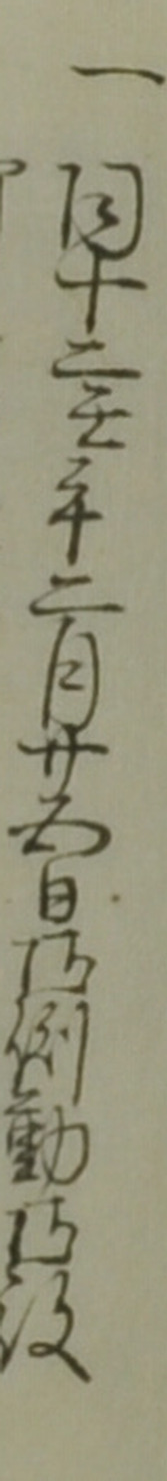一同十二壬午二月廿五日御側勤御役
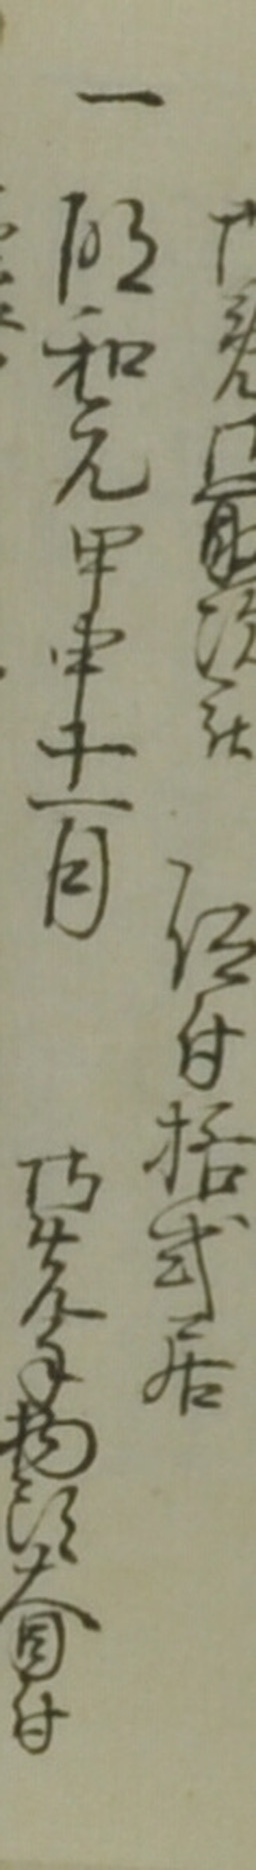一明和元甲申十一月御先手物頭大目付
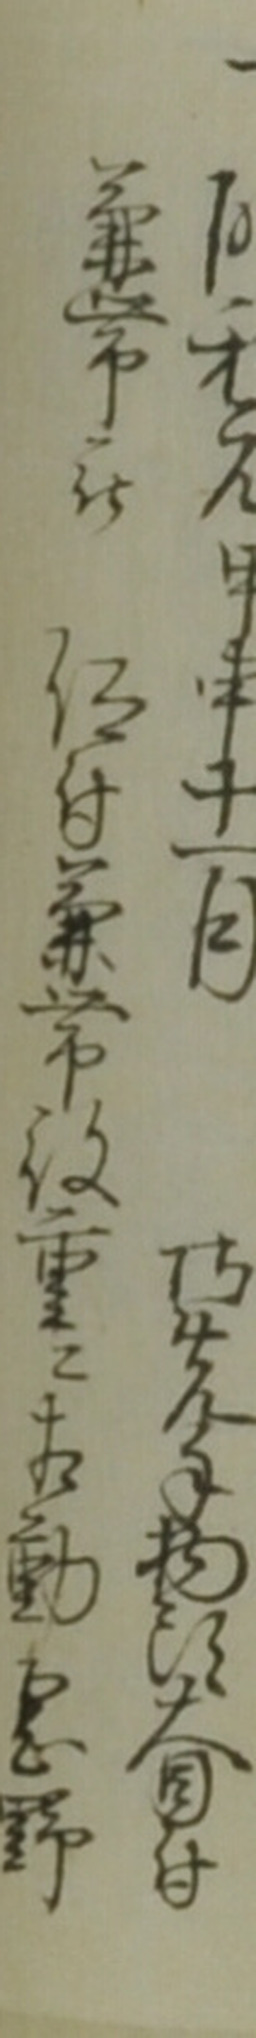兼帯被仰付兼帯役重ニ相勤岡野
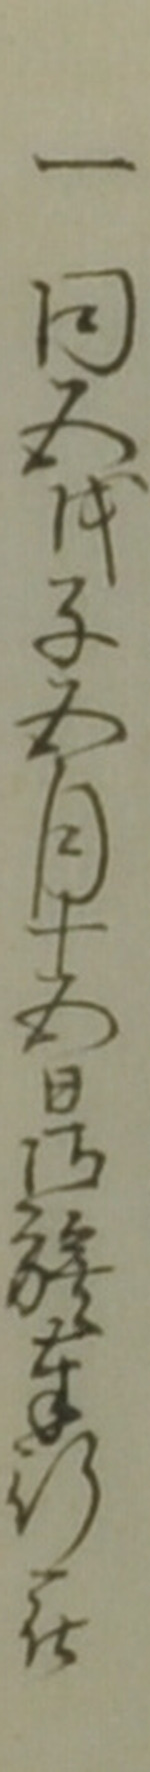一同五戊子五月十五日御旗奉行被
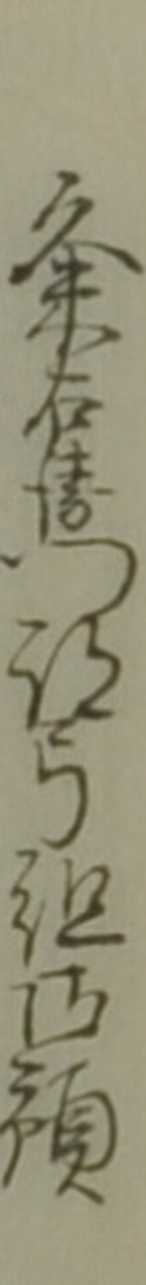粂右衛門御弓組御預
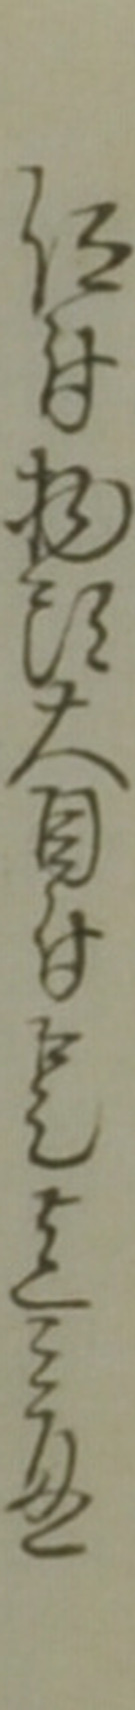仰付物頭大目付是迄之通
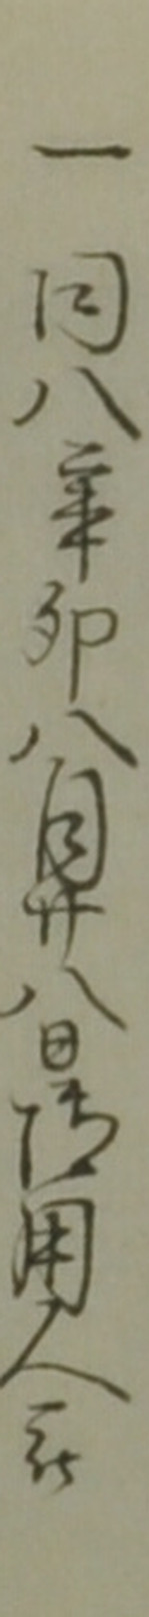一同八辛卯八月廿八日御用人被
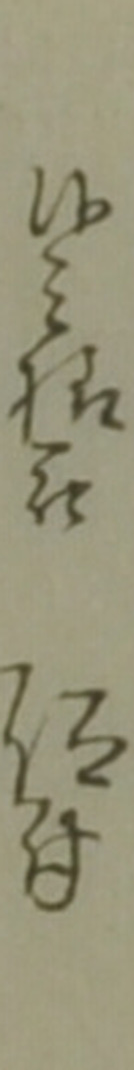候之様被仰付
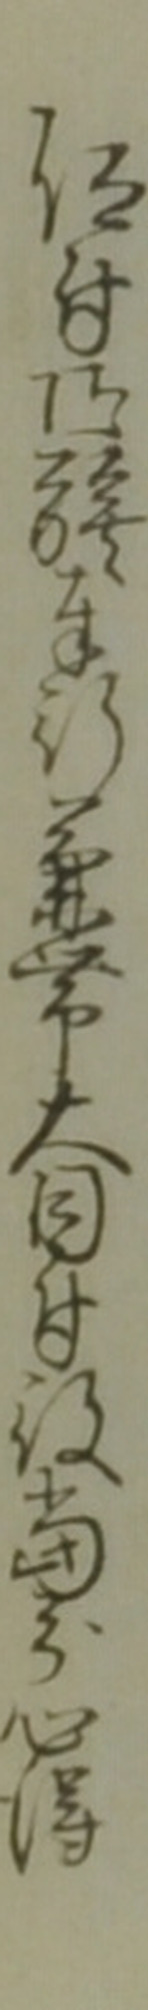仰付御旗奉行兼帯大目付役当分心得
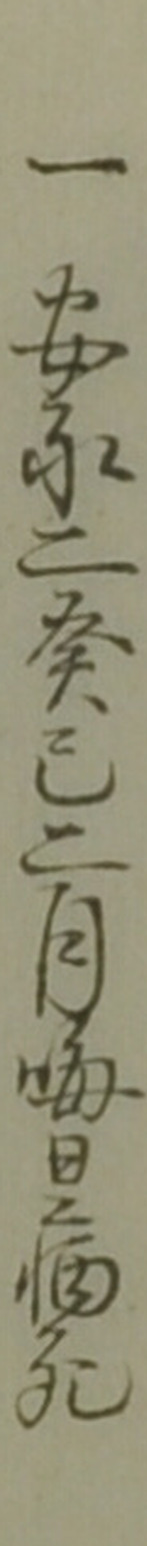一安永二癸巳二月晦日病死
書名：給人諸士勤仕録（三）
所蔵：伊那市立高遠町図書館・合同会社AMANE
